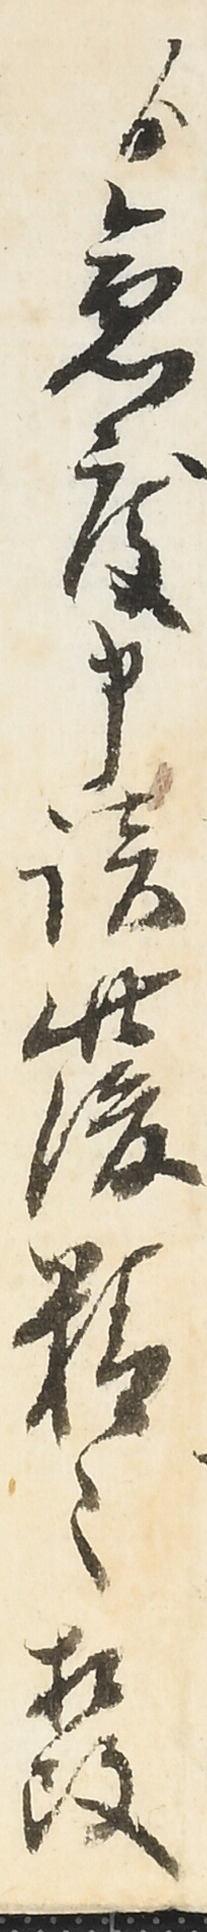ゟ急度申談此後精々相改
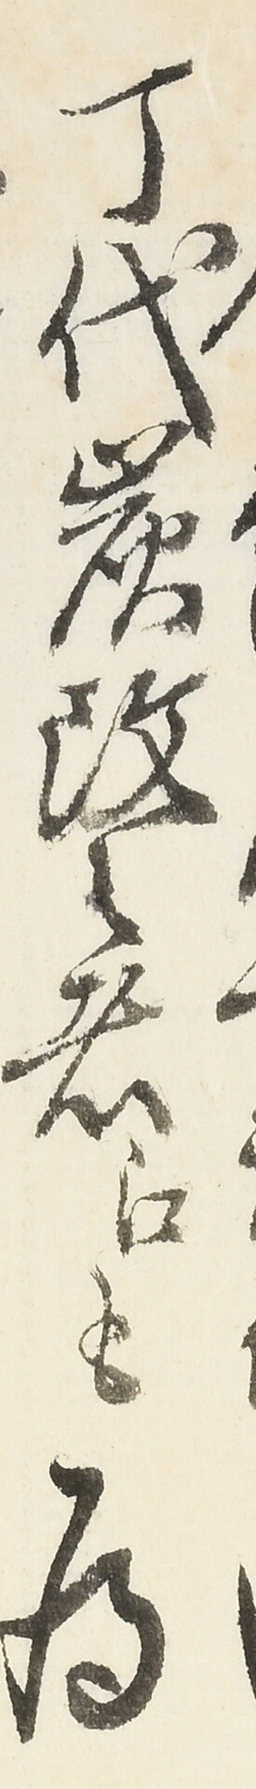丁代炭改之者江も為
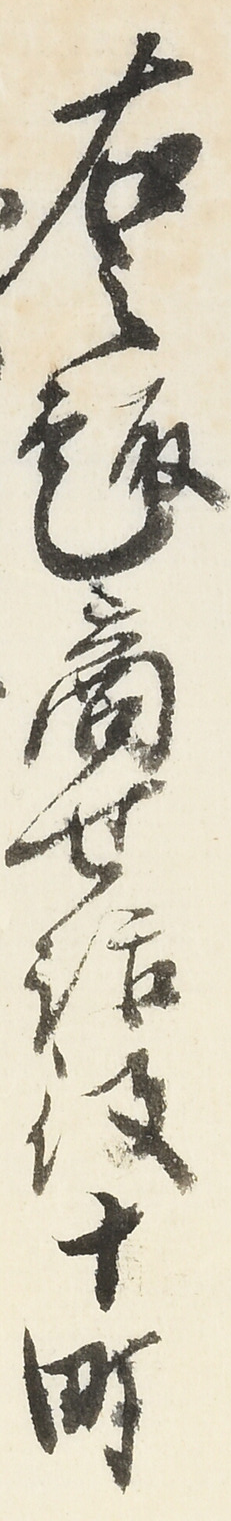右之趣商世話役十町
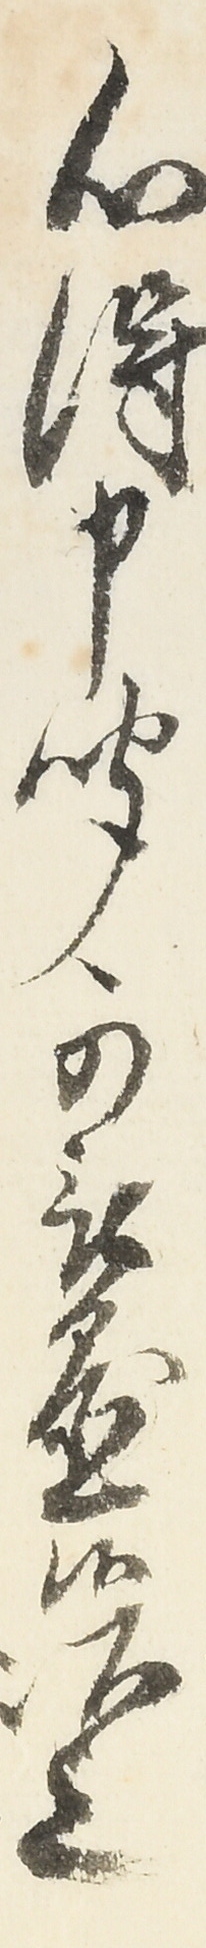心得申聞可被置候以上
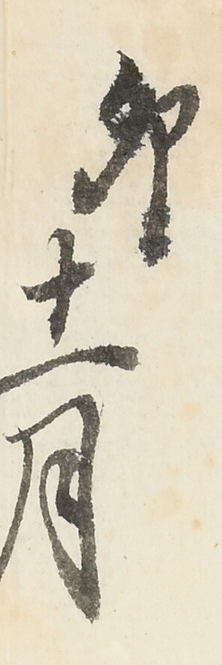卯十一月
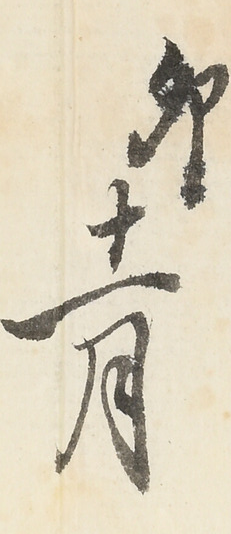卯十一月
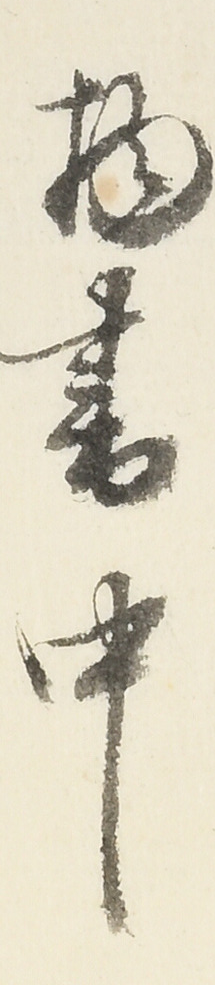物書中

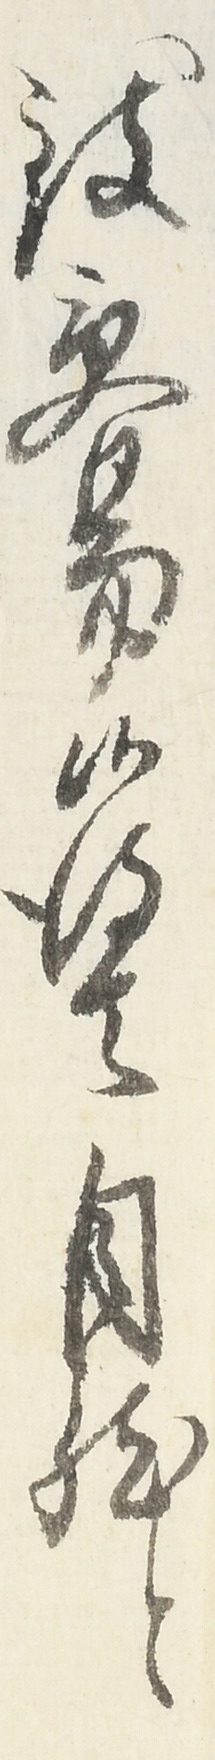致交易候得者自然と
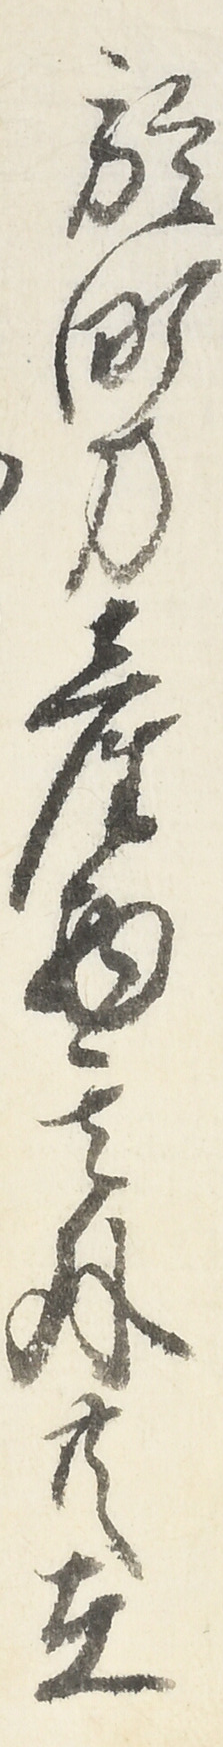於町方産物其外共在
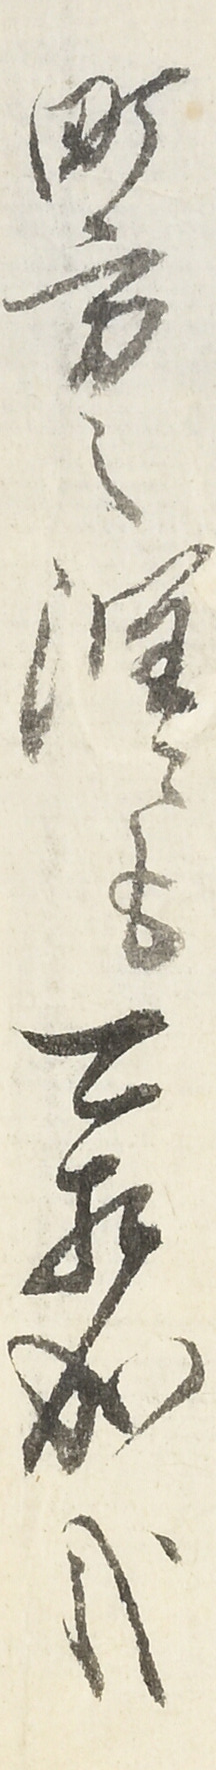町方之潤ニも可相成哉
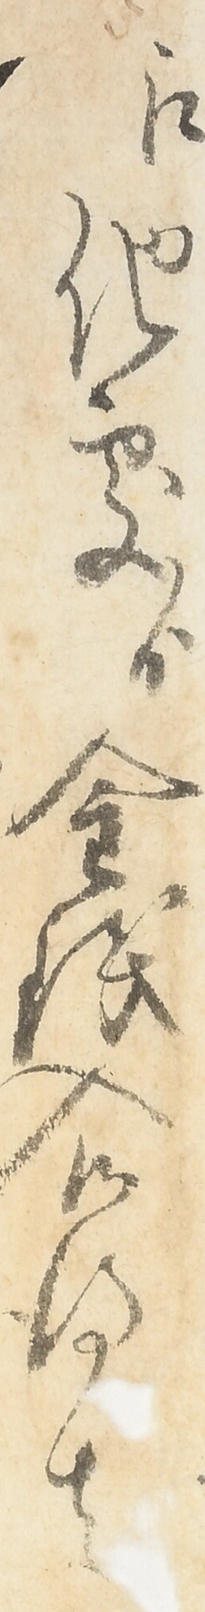江他処ゟ金銭入候得者
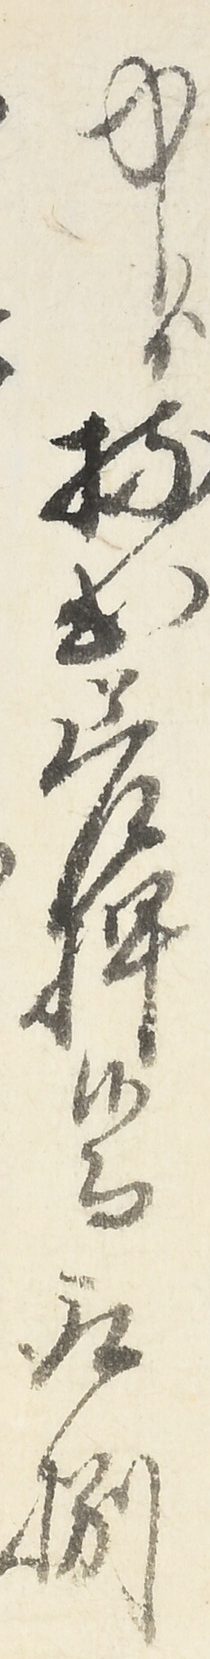中ゟ持出差押候而取捌
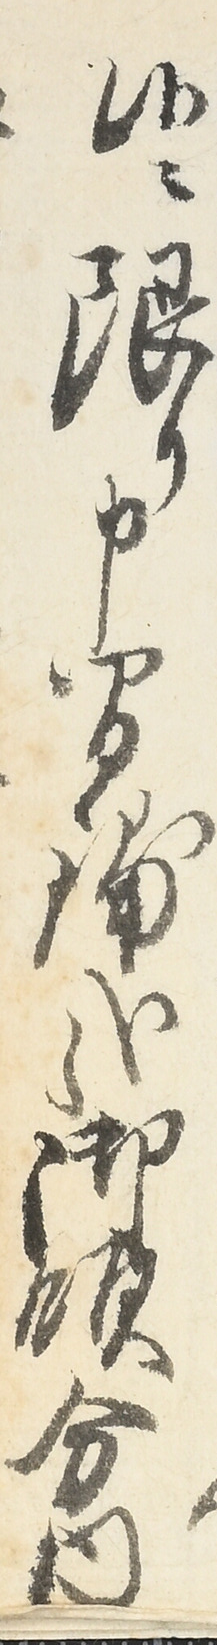候ニ限り申間敷哉御領分内
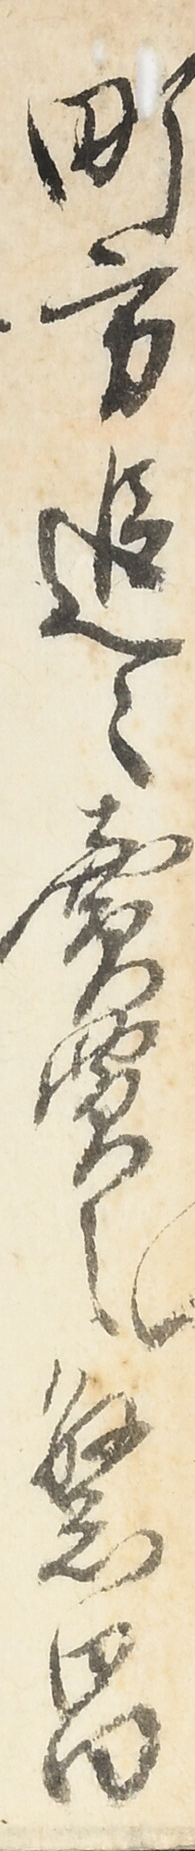町方追々売買之繁昌
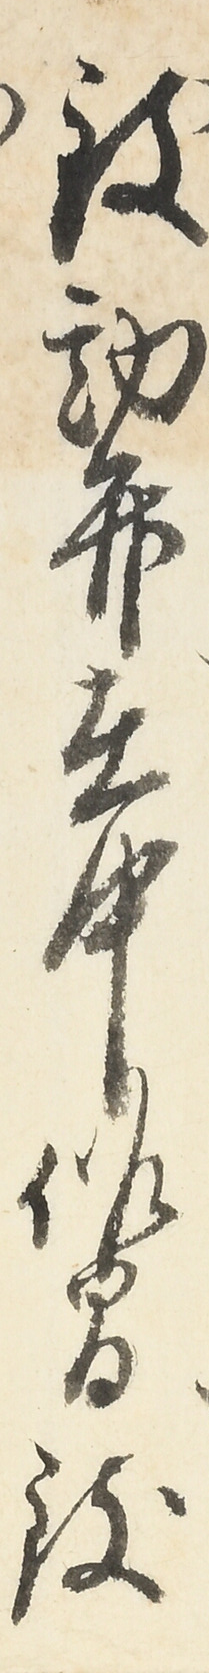致勘弁在中作間致
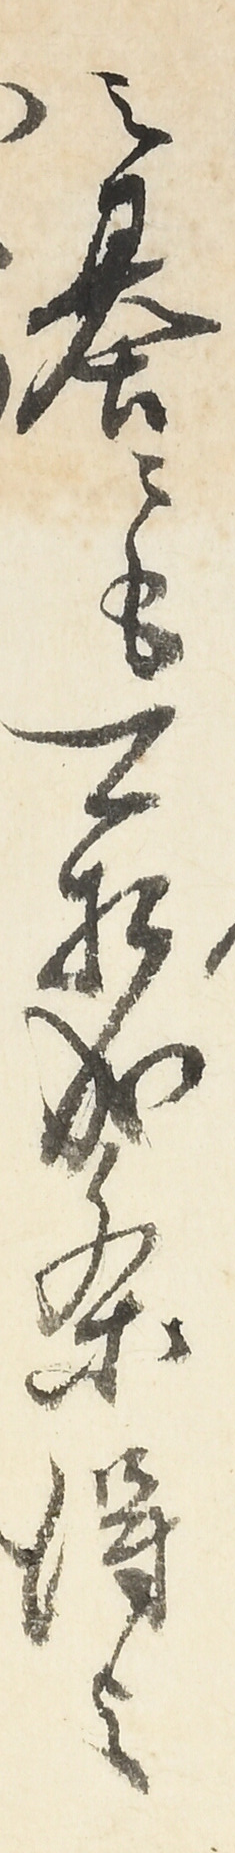之基ニも可相成条得与
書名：町方江別紙申渡
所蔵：伊那市立高遠町図書館・合同会社AMANE
